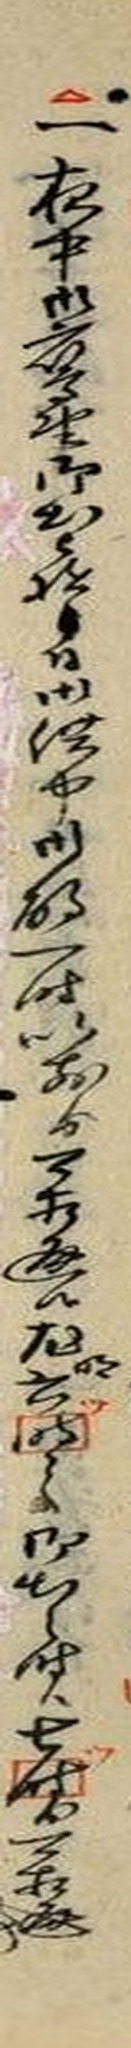△一夜中御鷹野御出被遊候付御供中御触一時以前ゟ可相通候尤明六時ニ而御出之時ハ七時ゟ可相通事
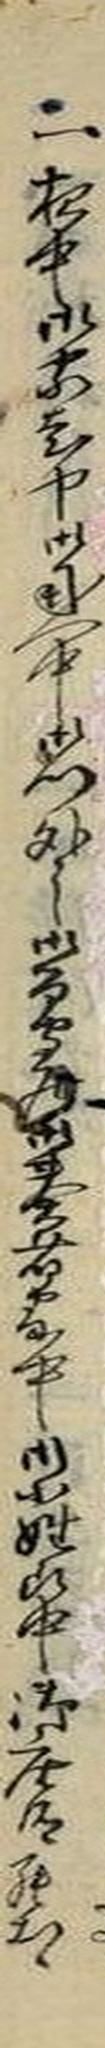●一夜中之御家老中御用人中御門外之御留守居御奏者番中御小姓頭中御座所罷出候
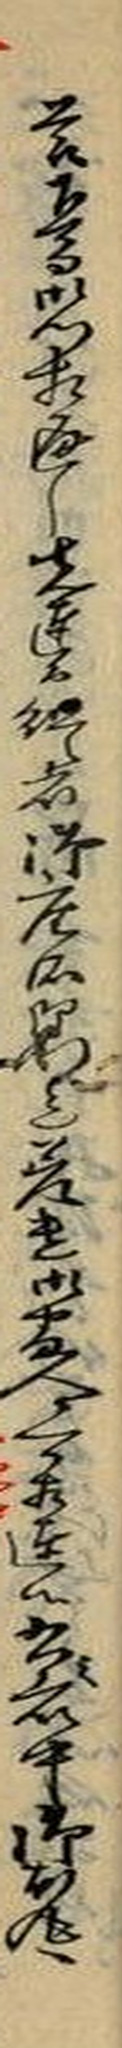節下馬御門相通之先達而組之者御座所御門迄差遣御番人ニ可相達候右之者中御本丸へ
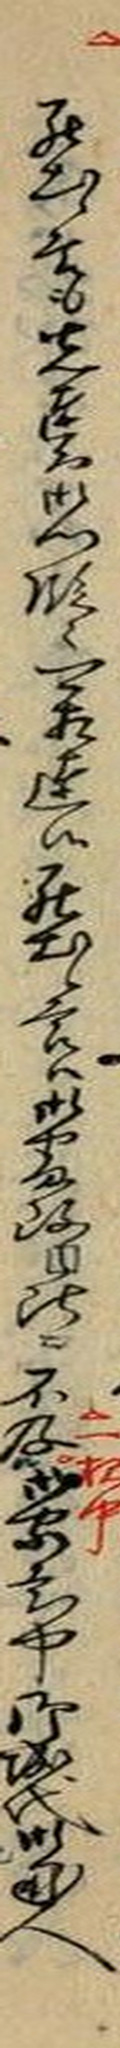罷出候節も先達而御門段々可相達候罷出候節ハ御番改之断ニ不及御家老中御城代御用人
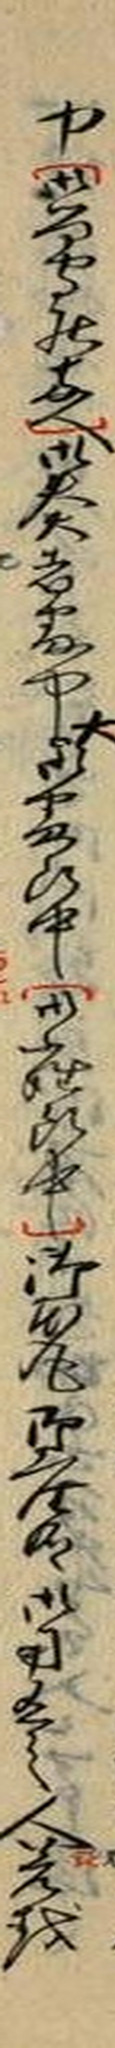中御留守居両人御奏者番中大御番頭中御小姓頭中御本丸御座所へ御用有之人差越
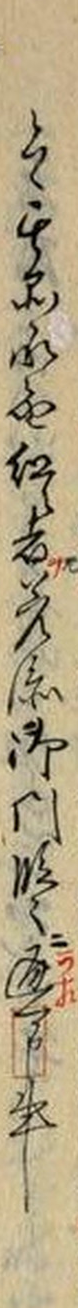候ハヽ其品承届組之者差添御門段々ニ可相通事
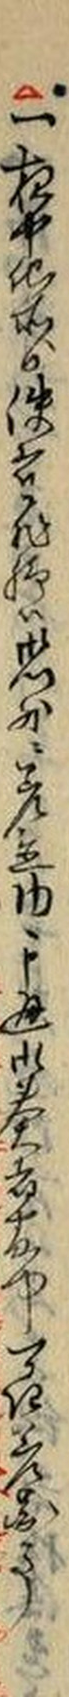△一夜中他所ゟ使者飛脚ハ御門外ニ差置内へ申通御奏者番中可任差図事
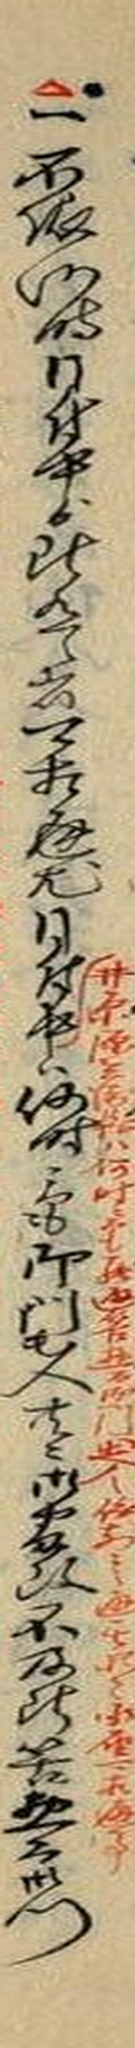△一不依何時目付中ゟ断有候者可相通尤目付中ハ何時ニ而も御門出入共ニ御番改不及断筈惣而御門
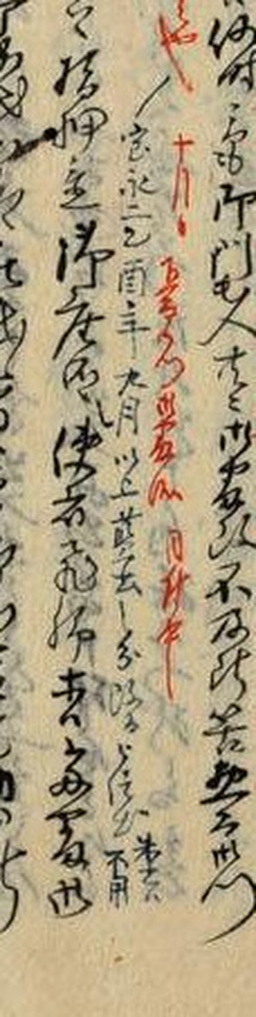宝永二乙酉年九月以上藍書之分改而仰出朱書ハ不用
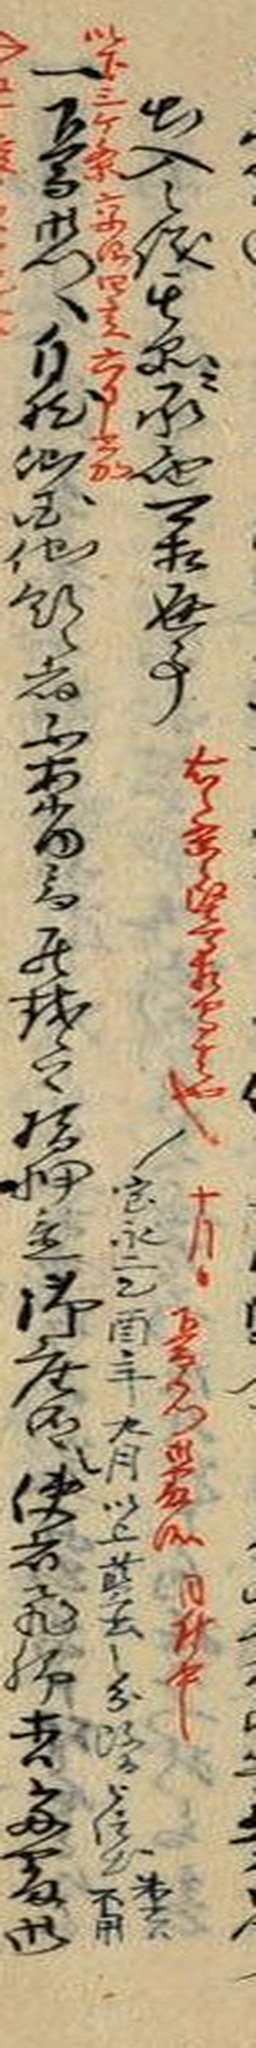一下馬御門へ自然他国他領之者不案内ニ而罷越候ハヽ差押置御座所へ之使者飛脚等ハ当番御
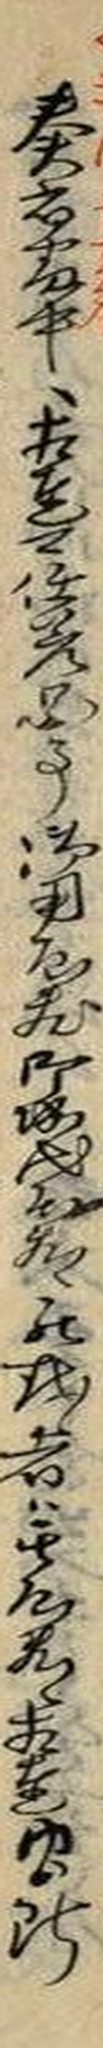奏者番中へ相達可任差図事御用屋敷御城代屋敷へ罷越候者ハ其屋敷へ相達内ゟ断
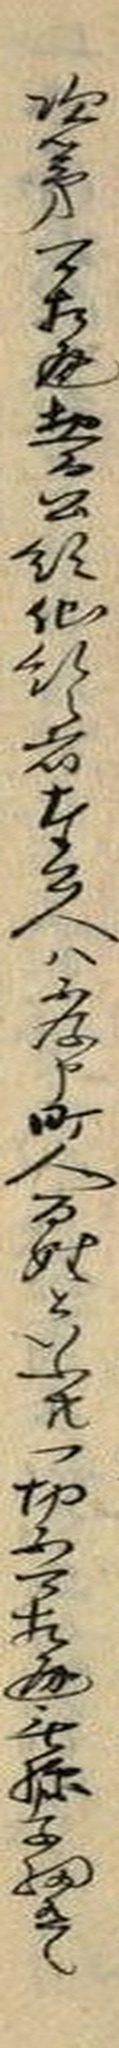次第可相通惣而公領他領之者奉公人ハ不及申町人百姓といふとも一切不可相通無拠子細有之
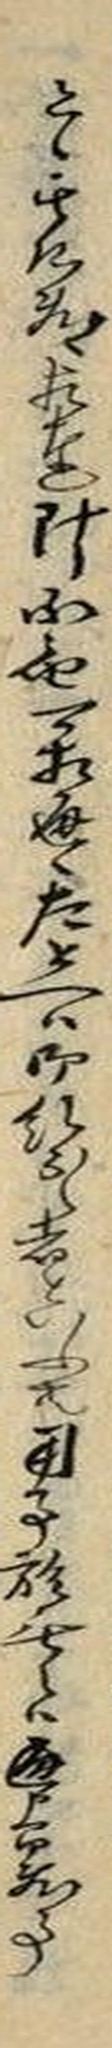候ハヽ其屋敷へ相達断承届可相通候たとへハ御領分之者といふ共用事於無之ハ通申間敷候事
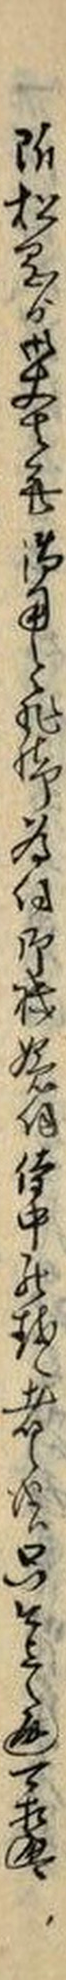附松岡ゟ御使者并御用之飛脚為伺御機嫌伺侍中罷越候者之儀ハ只今迄之通可相通候
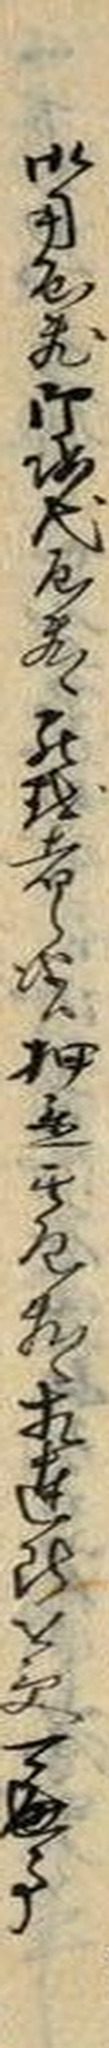御用屋敷御城代屋敷へ罷越候者之儀ハ押置其屋敷へ相達断を受可通事
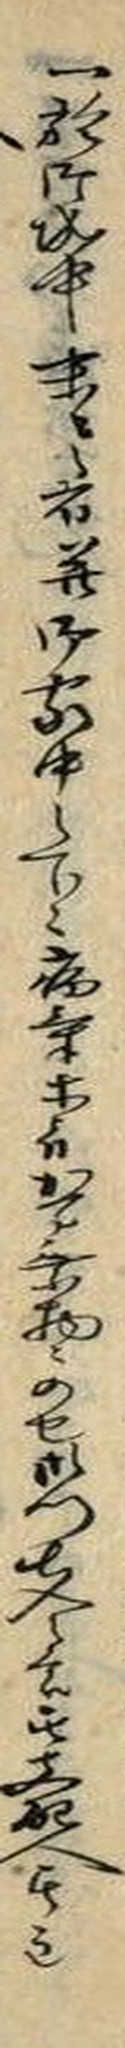一於御城中末々之者并御家中之下々病気等ニ付駕乗物ニのせ御門出入之節其支配人其主
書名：御門御櫓之部
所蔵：福井県文書館 Fukui Prefectural Archives
